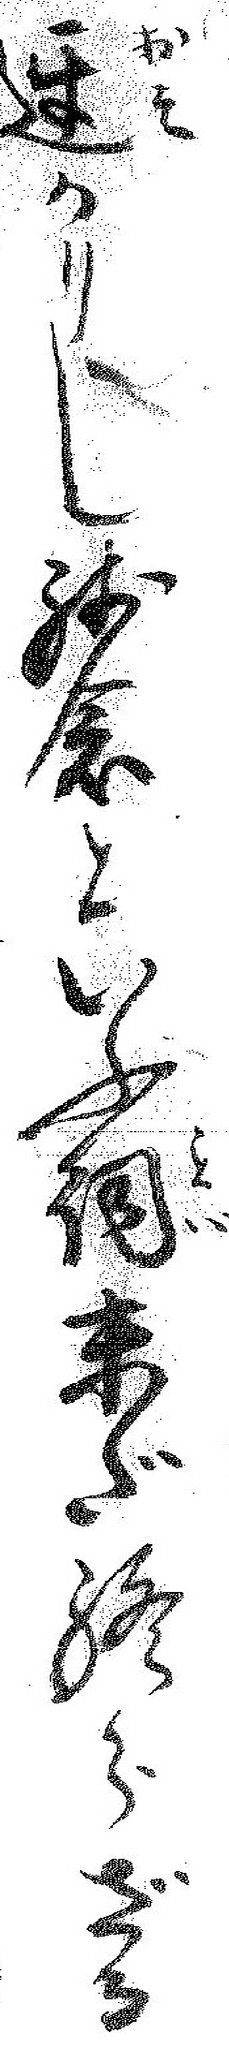遅かりし残念といふ詞未だ終らざる
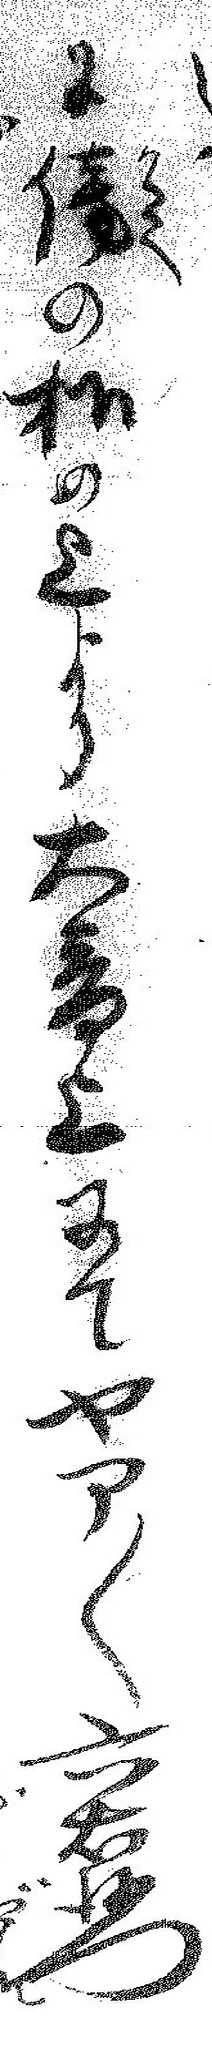に傍の杉の上より大音上にてヤア〳〵六右衛門
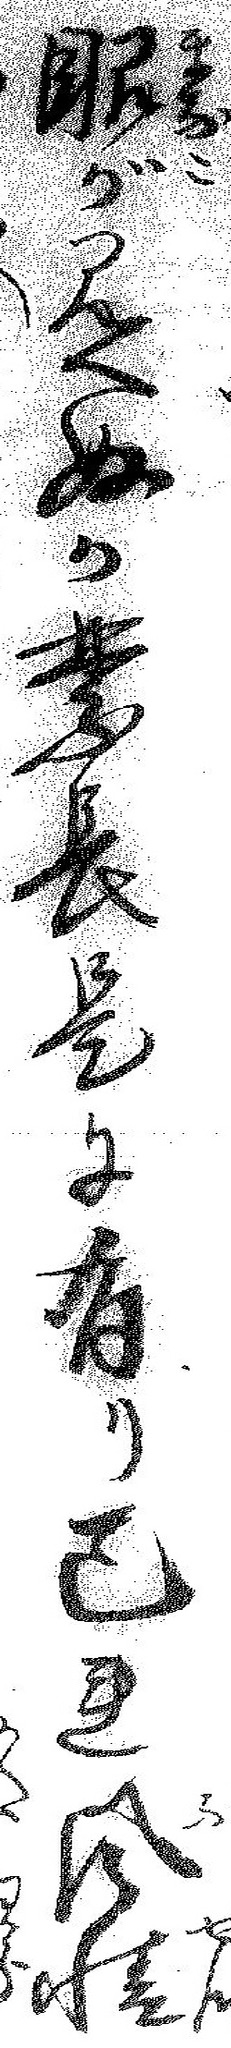眼が見へぬか禁長是に有り己れ風情
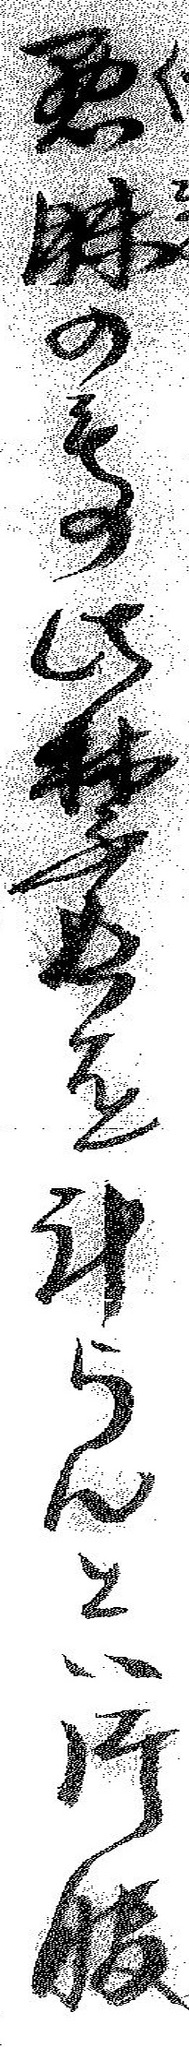悪昧のもの此禁長を斗らんとは片腹
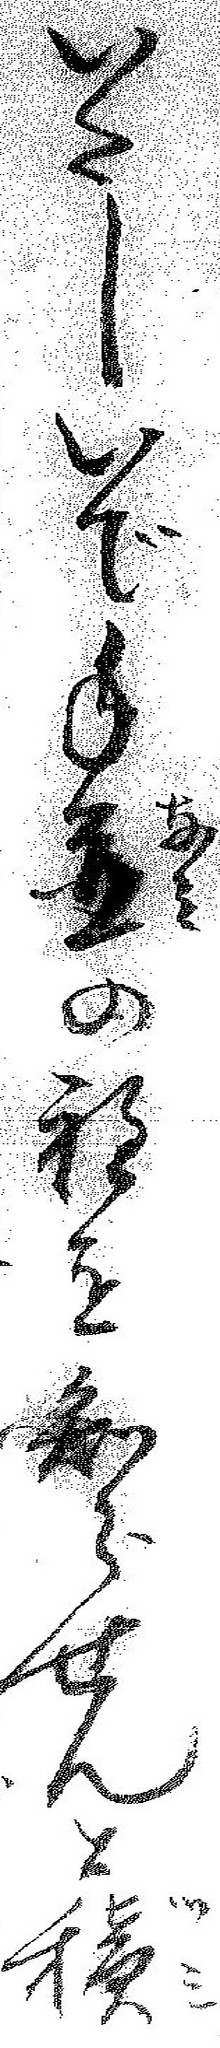いたしいで手並の程を知らせんと積
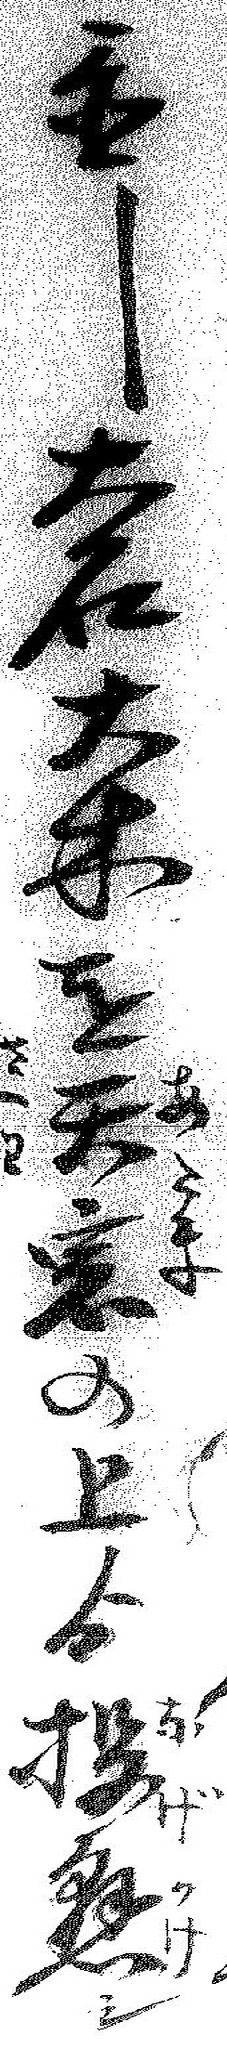置し大石大木を天窓の上より投懸し
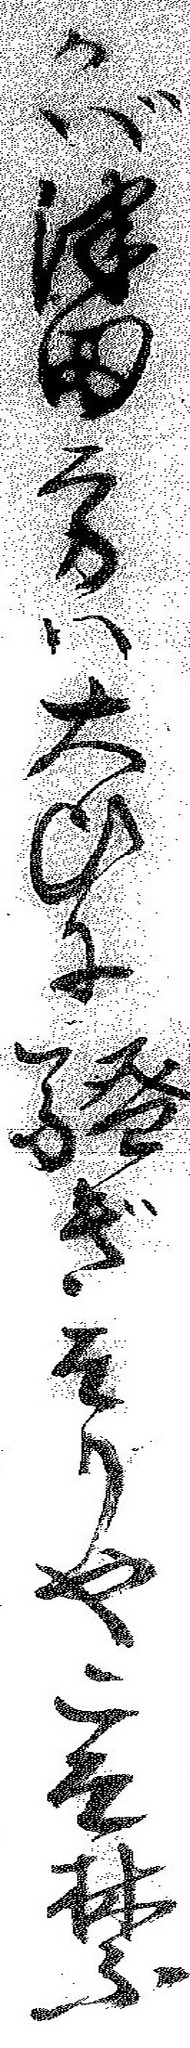かば津田方は大ひに騒ぎそりやこそ禁
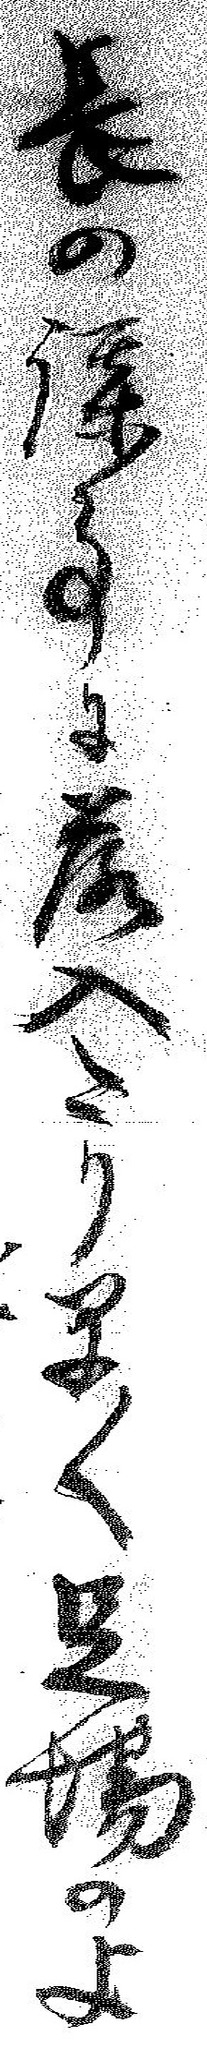長の謀事に落入たり早く足場のよ
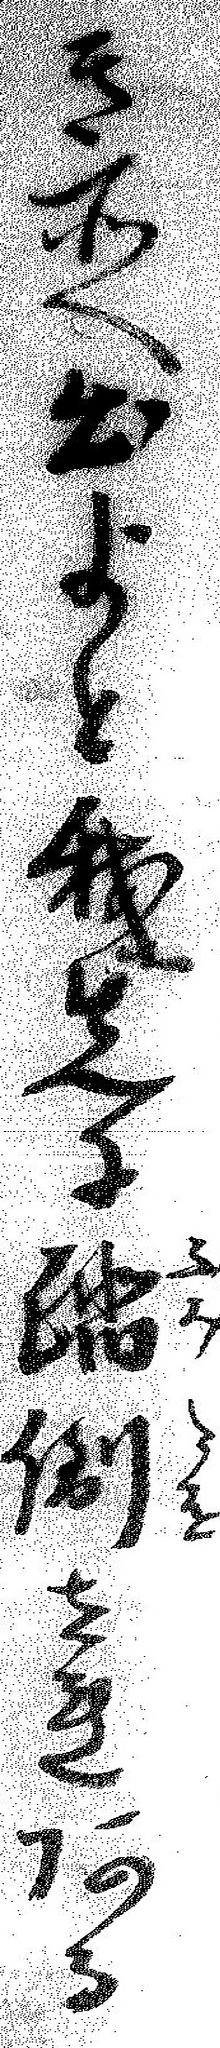き所へ出よと我先に踏倒されある

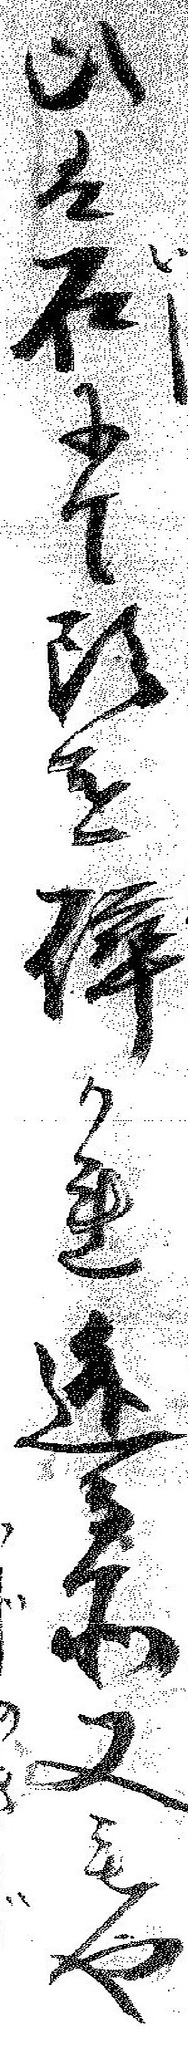ひは石にて頭を砕かれ逃る所又もや
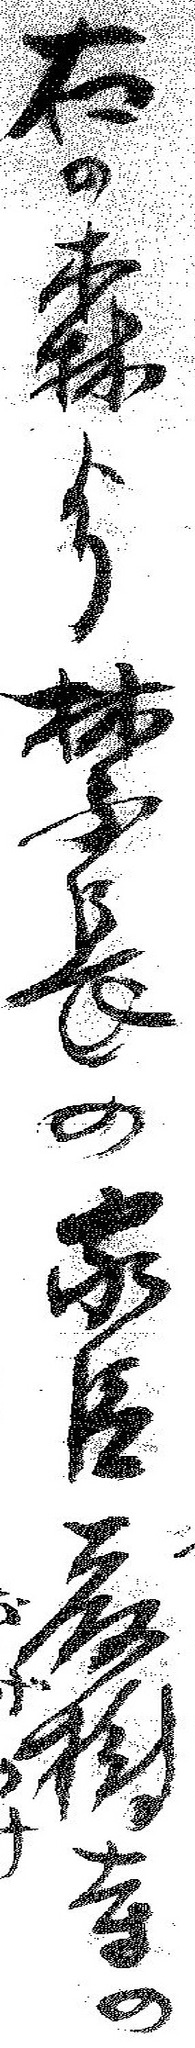右の森より禁長の家臣藤樹寺の
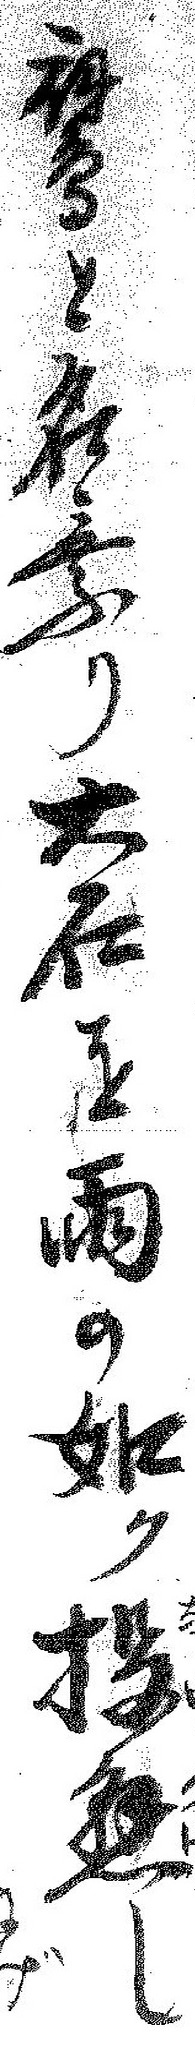鷹と名乗り大石を雨の如く投懸し
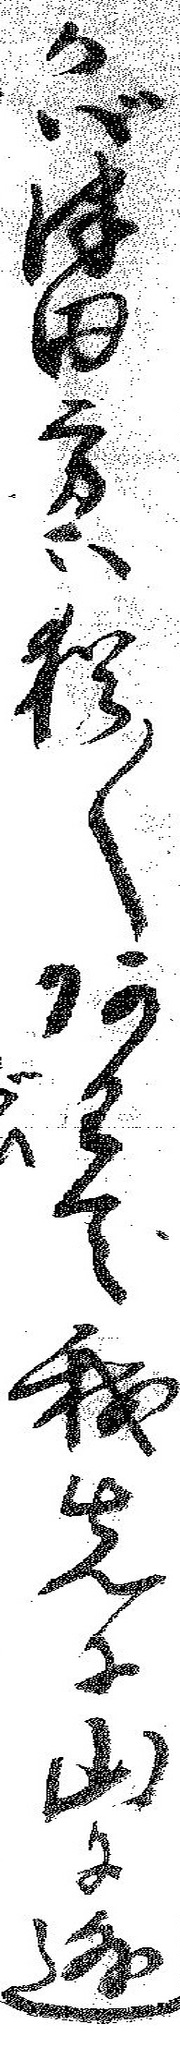かば津田方は猶〳〵あわて我先に山に逃
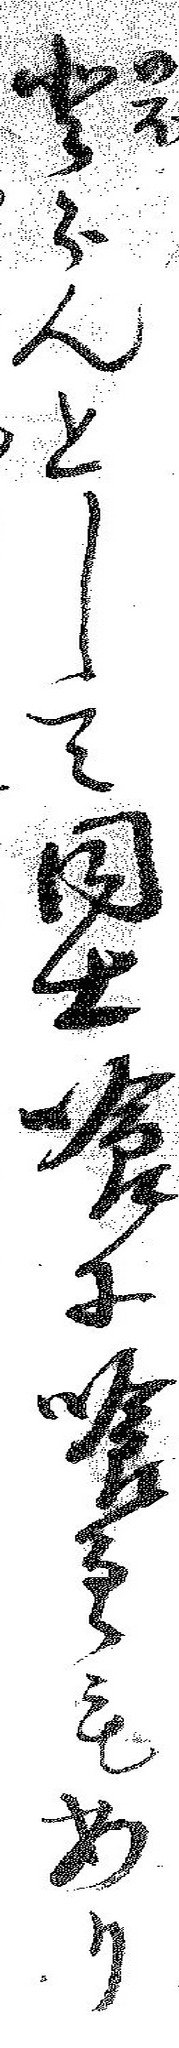登らんとして同士喰に喰るゝもあり
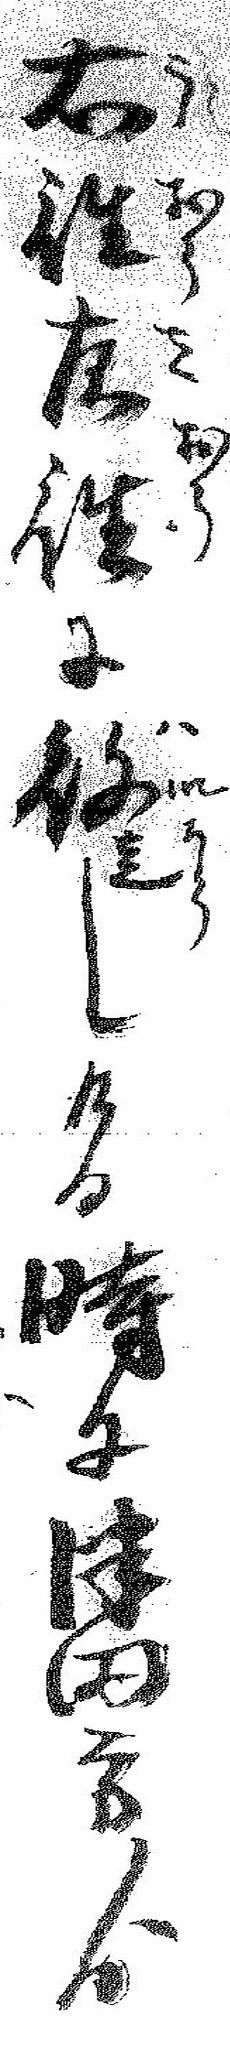右往左往に敗走しける時に津田方より
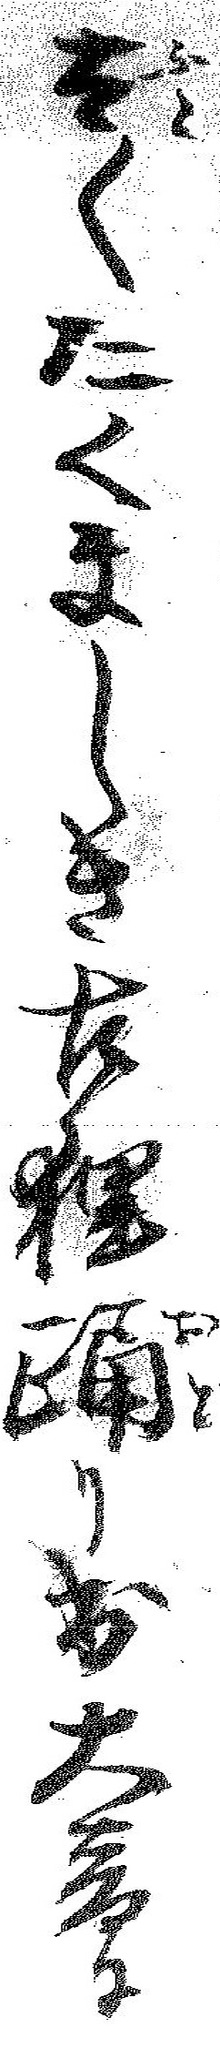太くたくましき古狸踊り出大音に
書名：近頃古狸珍説　礼義智信
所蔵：徳島県立図書館
